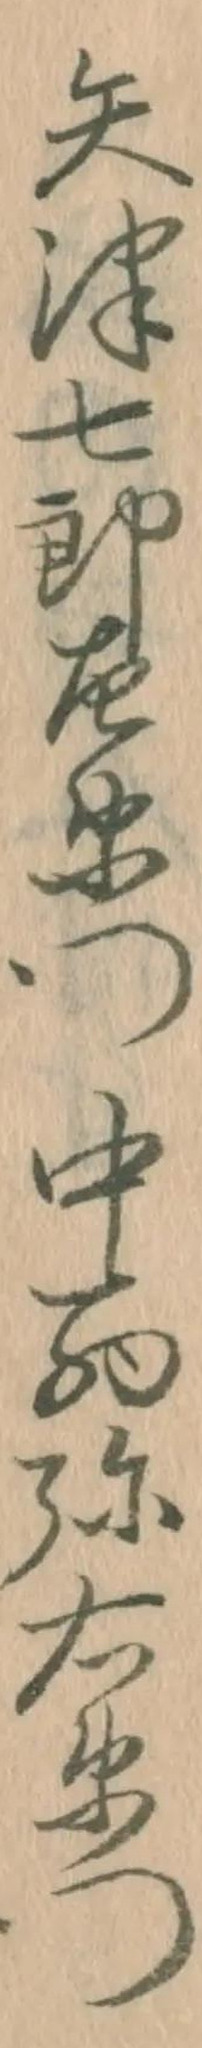矢津七郎左衛門中西弥右衛門
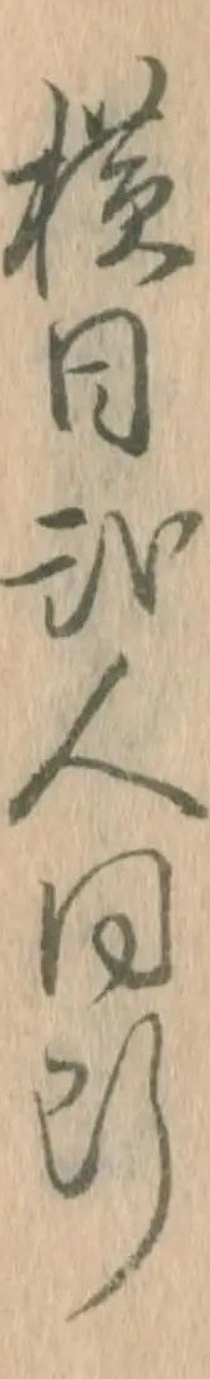横目弐人同断
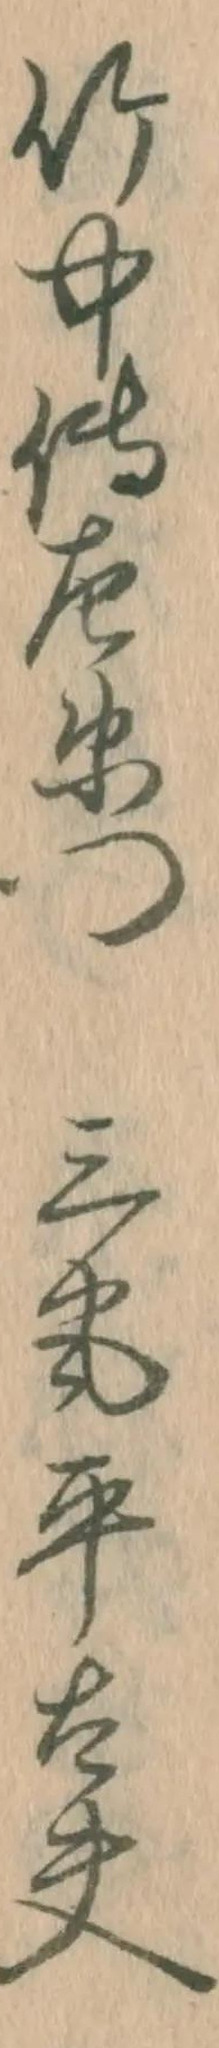竹中伝左衛門三宅平太夫
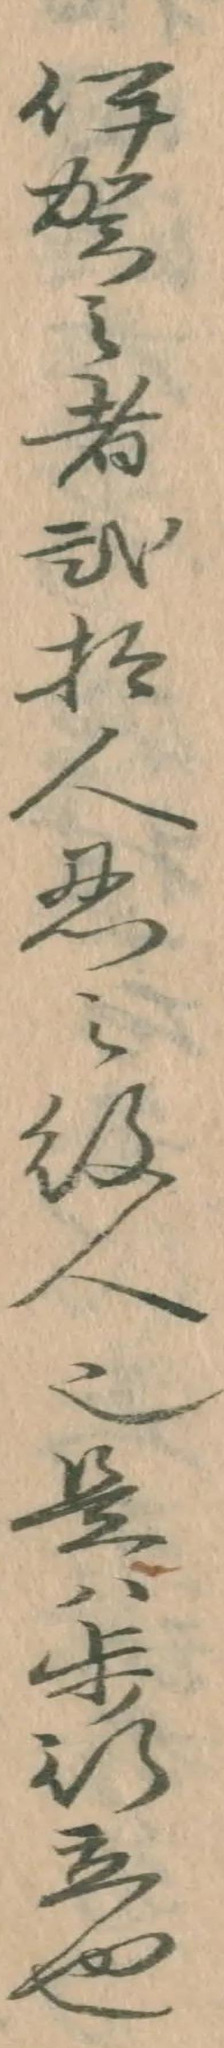伊賀之者弐拾人忍之役人也是は歩行立や
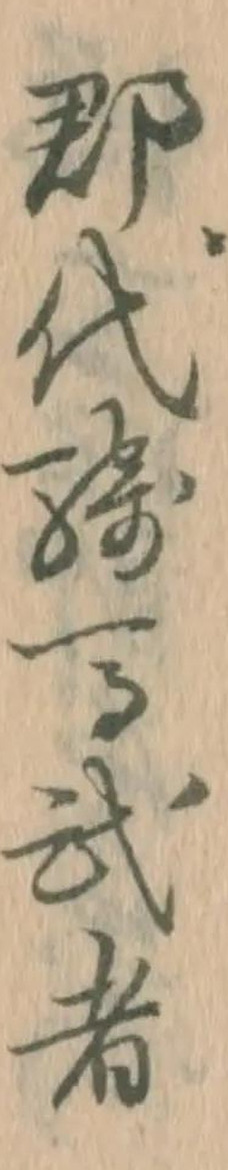郡代騎馬武者
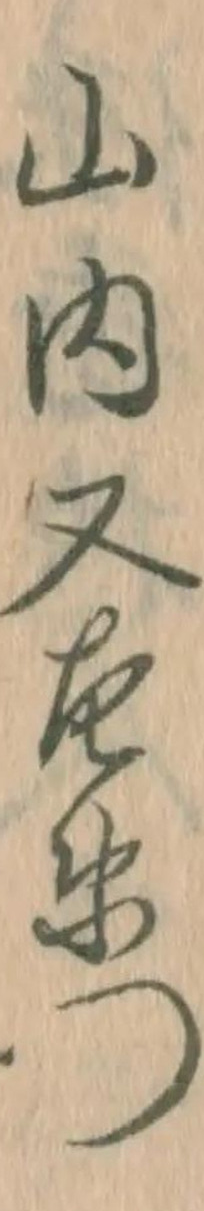山内又左衛門
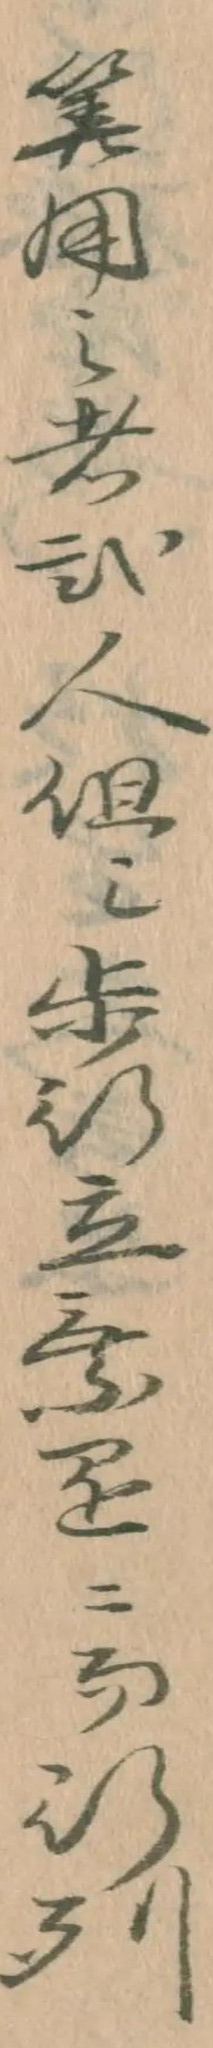算用之者弐人但し歩行立乗懸に而行列
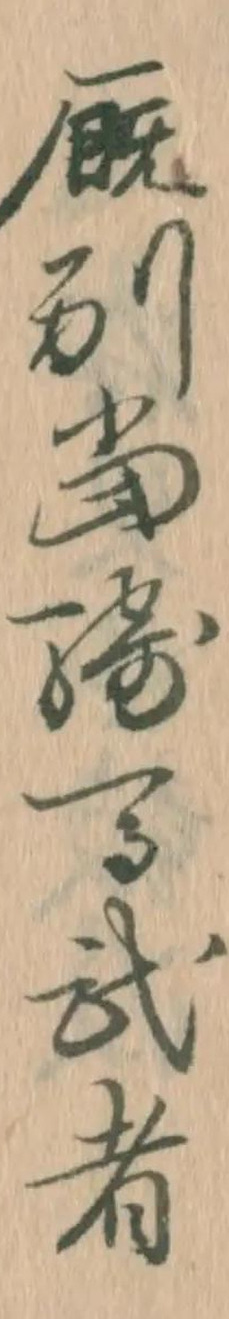厩別当騎馬武者
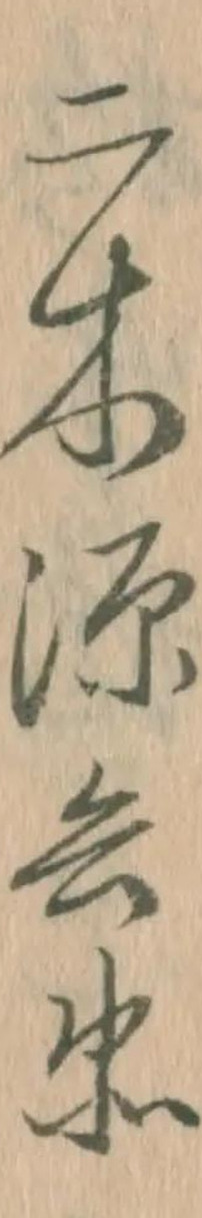二木源兵衛
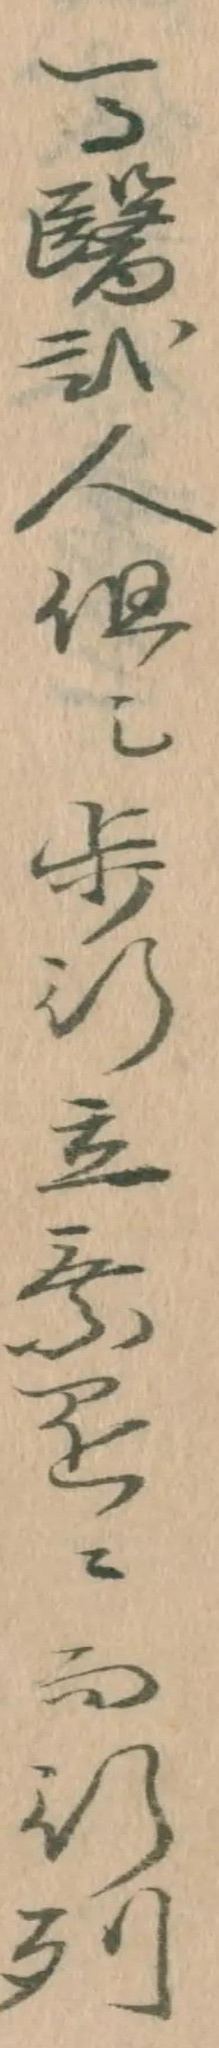馬醫弐人但し歩行立乗懸に而行列
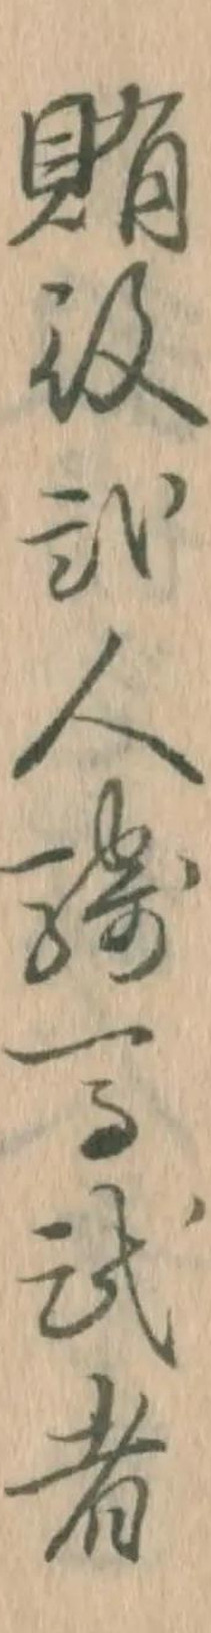賄役弐人騎馬武者
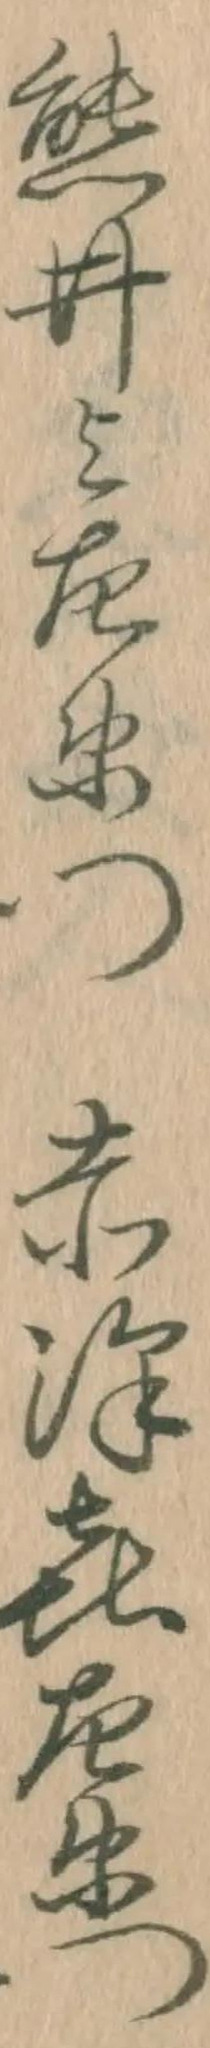熊井与左衛門赤沢喜左衛門
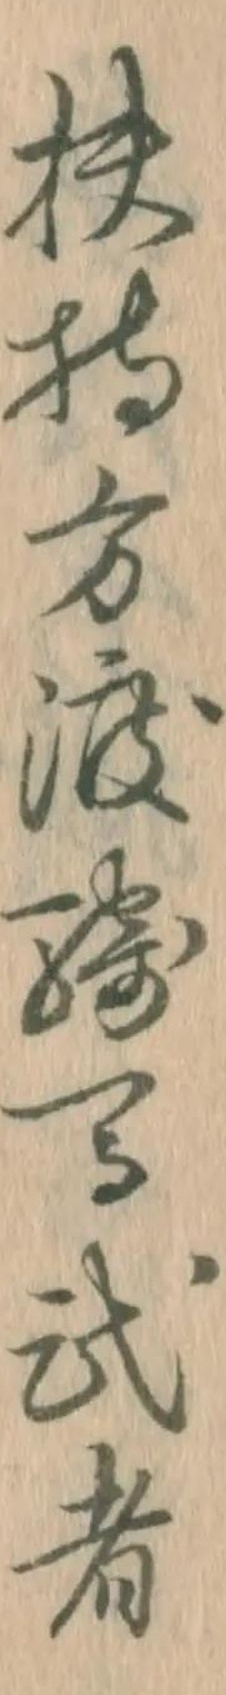扶持方渡騎馬武者
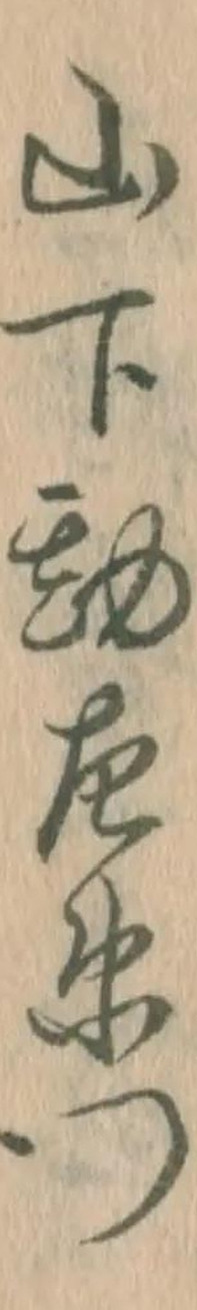山下勘左衛門
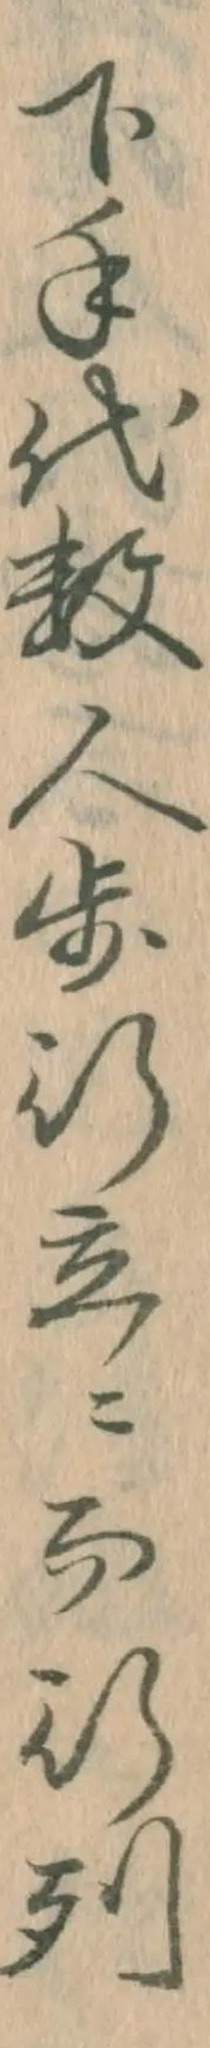下手代数人歩行立に而行列
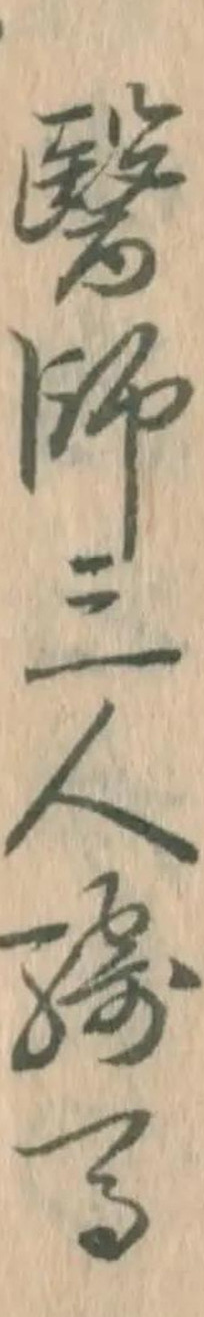醫師三人騎馬
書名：切支丹御退治記 49巻. [6]
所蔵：国立国会図書館 National Diet Library, JAPAN
